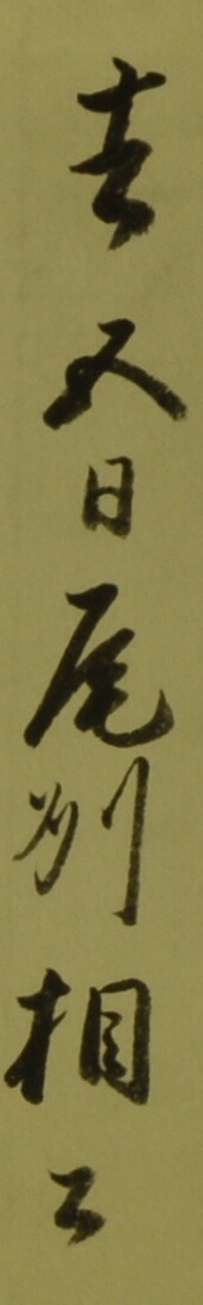去五日尾州相公
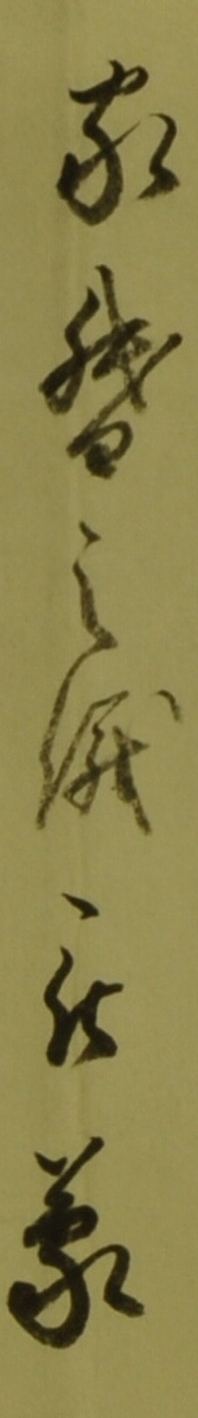家督之儀被蒙
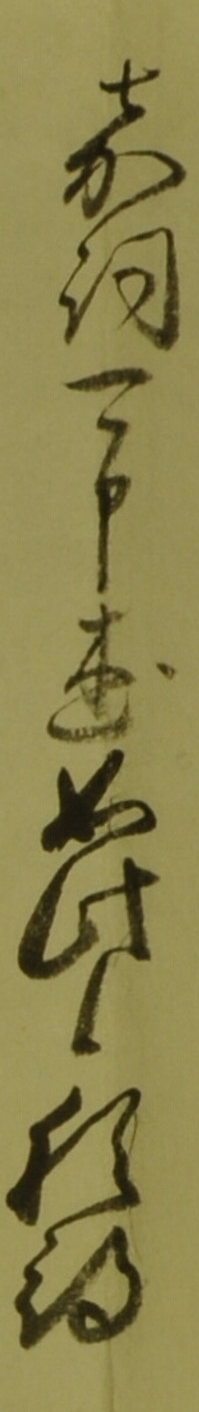嘉詞可申述如此候猶期
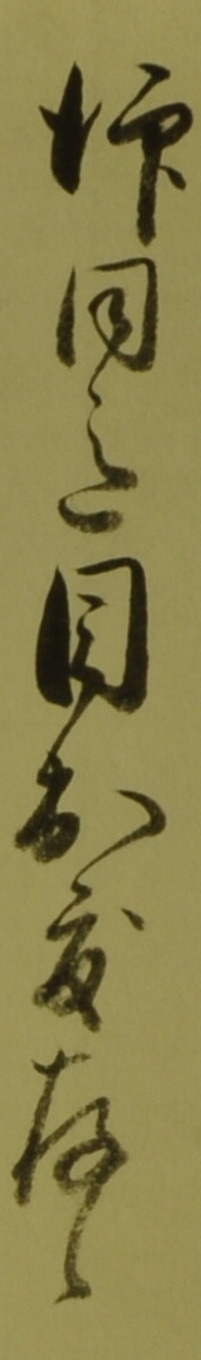仰同意目出度存候
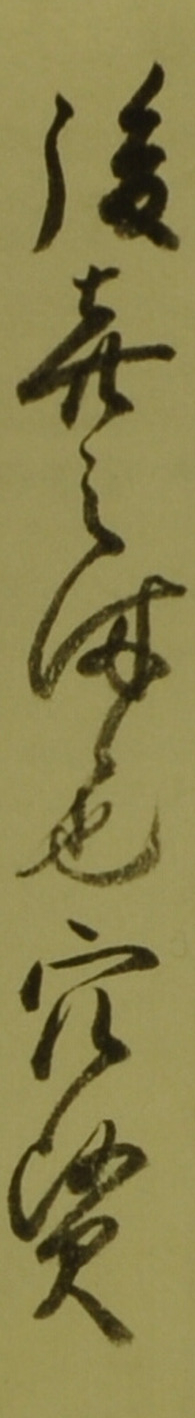後喜之時候也穴賢
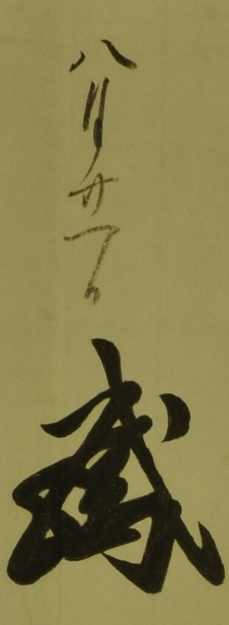八月廿一日
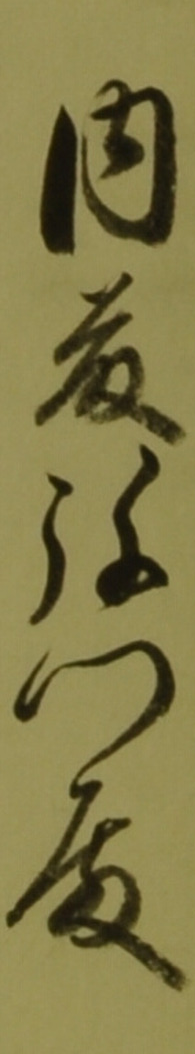内藤弥門殿
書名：書状
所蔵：伊那市立高遠町図書館・合同会社AMANE
